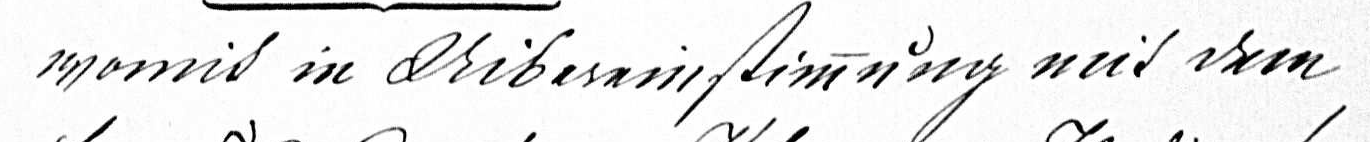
Womit in Uibereinstimmung mit dem
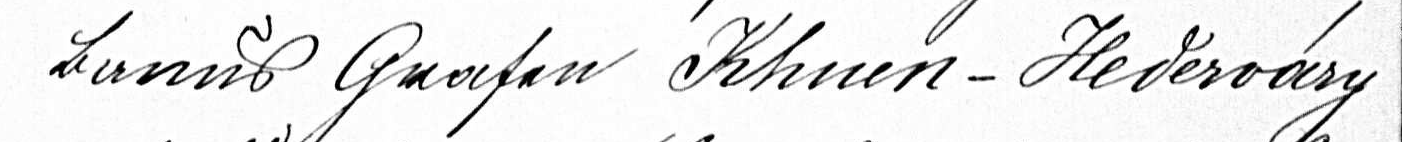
Banus Grafen Khuen-Hederváry
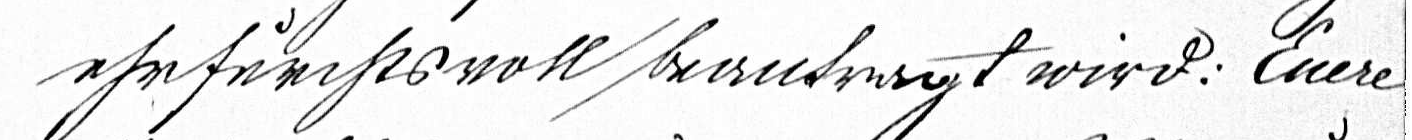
ehrfurchtsvoll beantragt wird: Euere
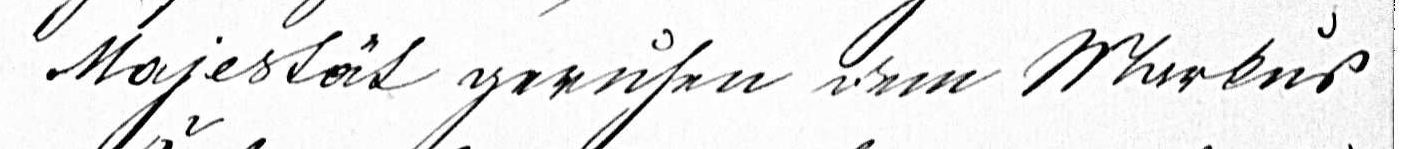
Majestät geruhen dem Markus
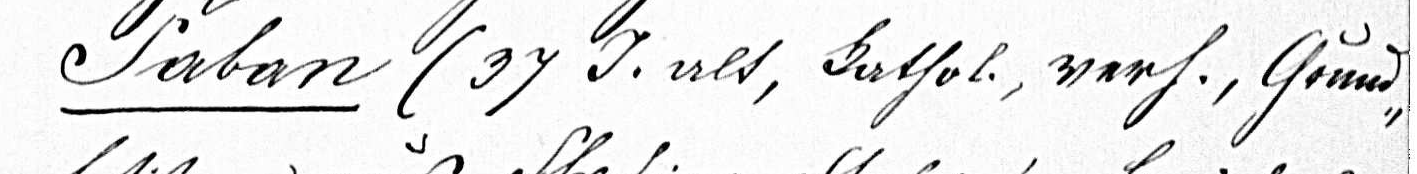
Šaban (37 J. alt, kathol, verh. Grund¬
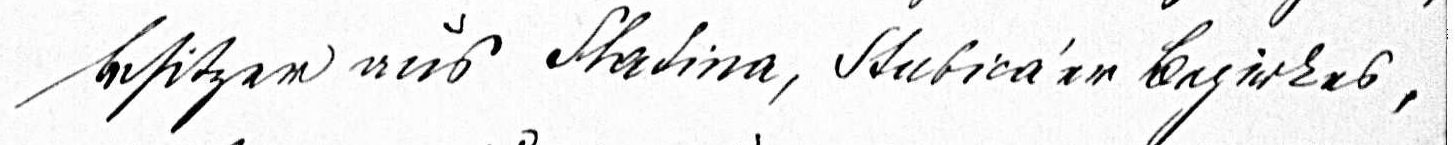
besitzer aus Slatina, Stubica’er Bezirkes,
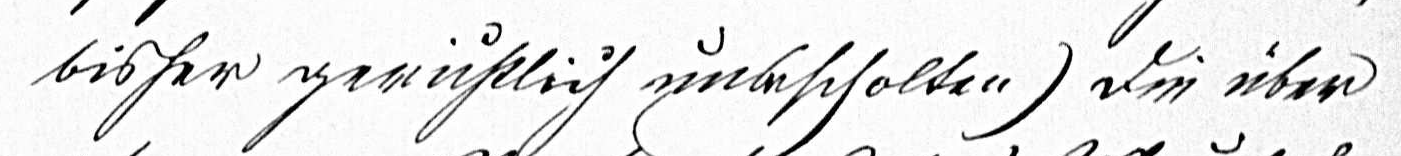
bisher gerichtlich unbescholten) die über
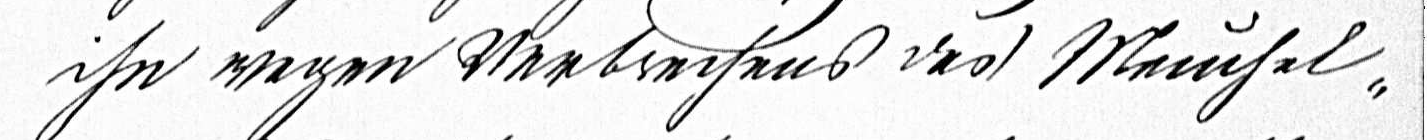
ihn wegen Verbrechens des Meuchel¬
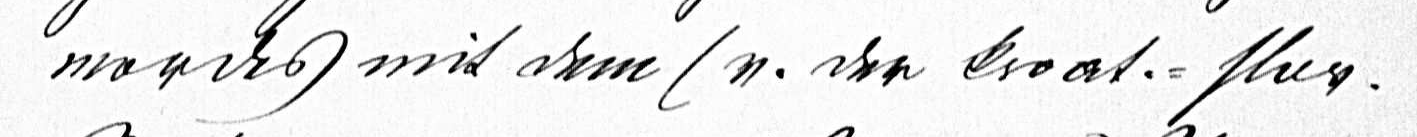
mordes mit dem (v. der kroat.-slav.
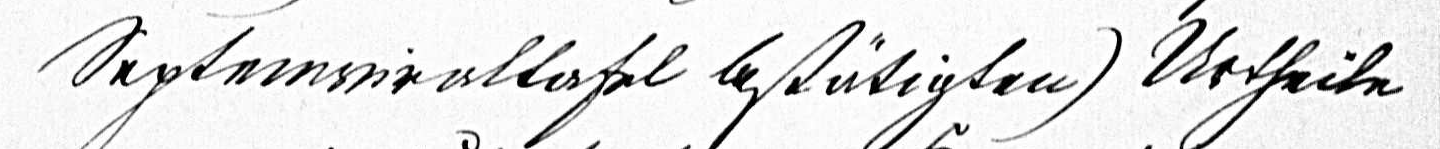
Septemviraltafel bestätigten) Urtheile
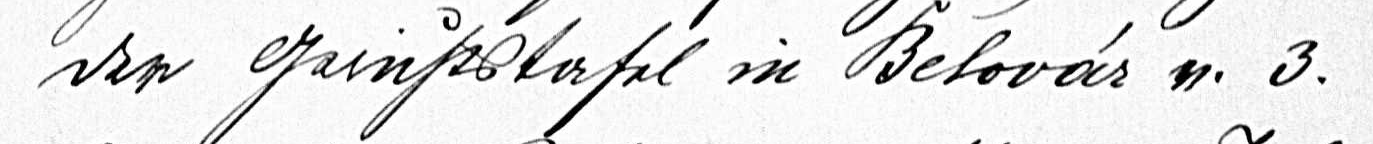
der Gerichtstafel in Belovár v. 3.
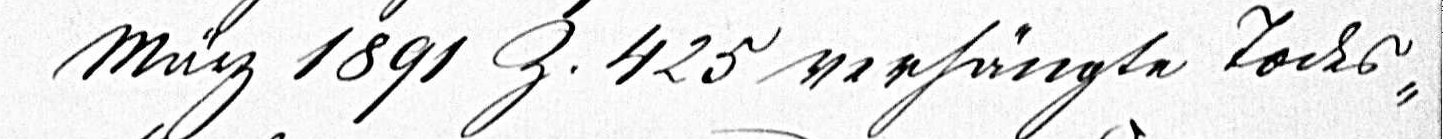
März 1891 Z. 425 verhängte Todes¬
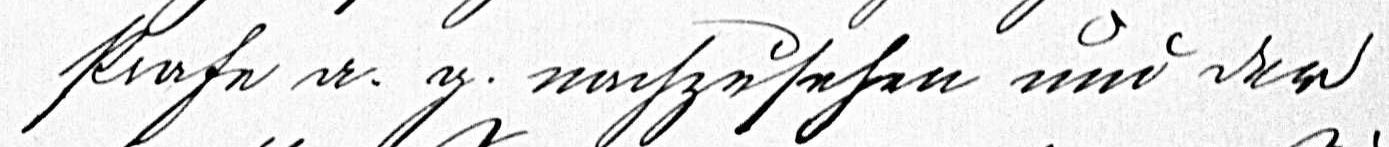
strafe a.g. nachzusehen und der
